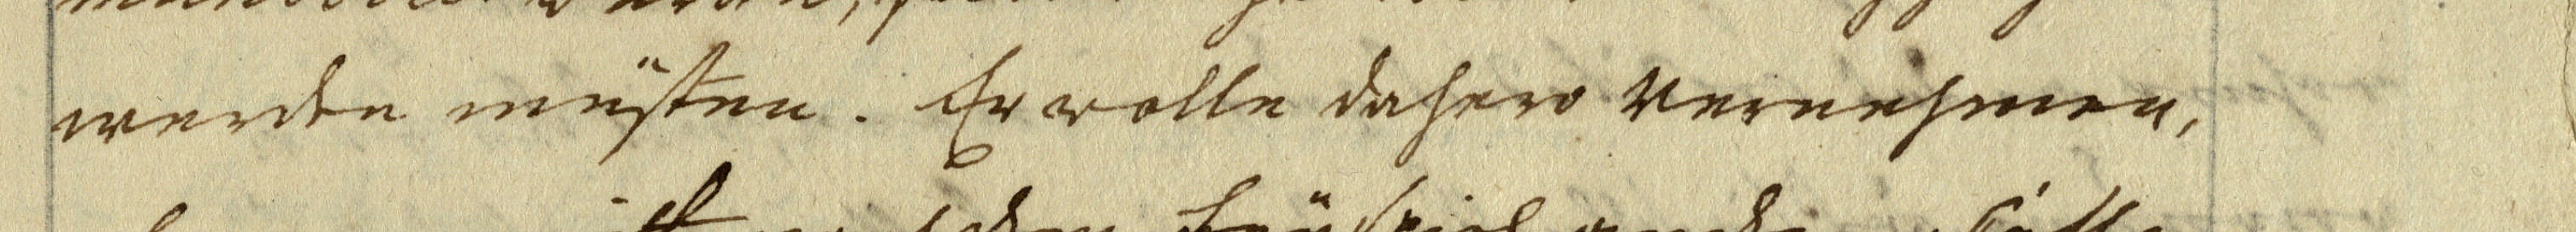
werden müsten. Er wolle dahero vernehmen,
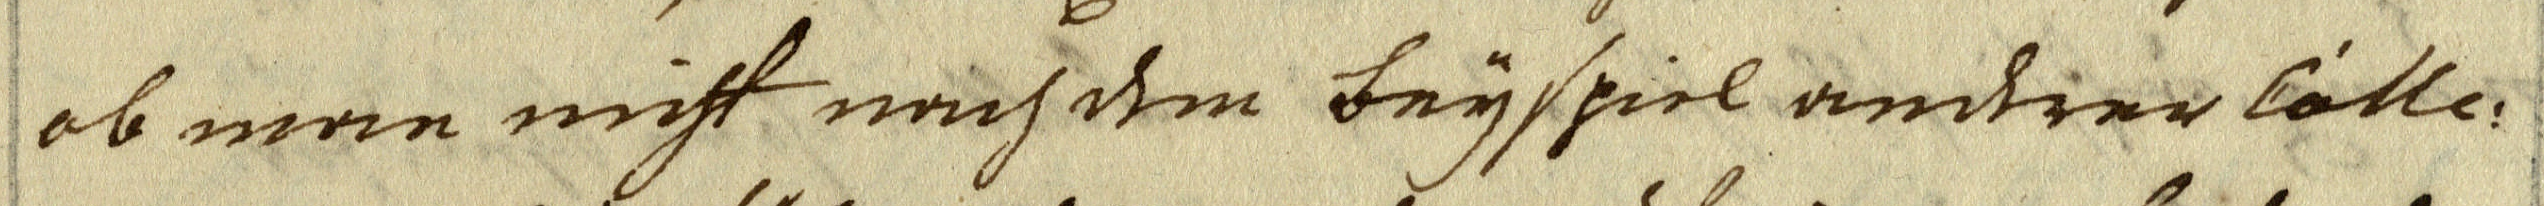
ob man nicht nach dem Beÿspiel anderer Colle¬
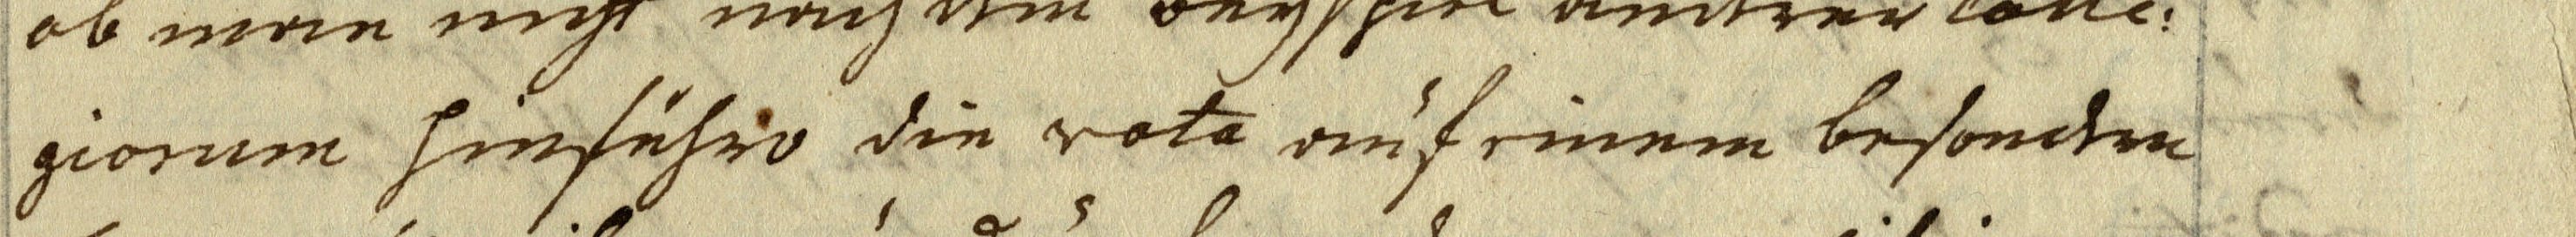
giorum hinführo die vota auf einem besondern
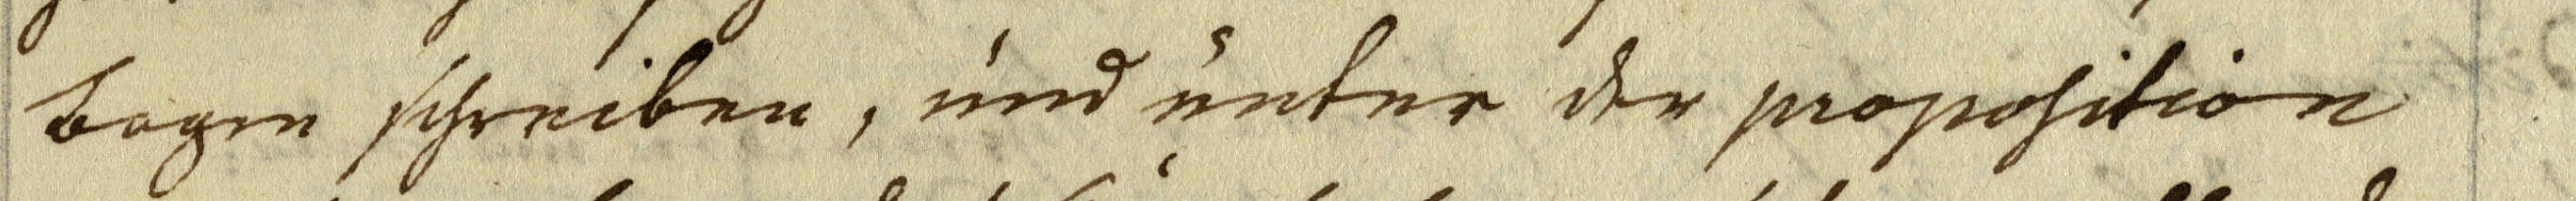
Bogen schreiben, und unter der proposition
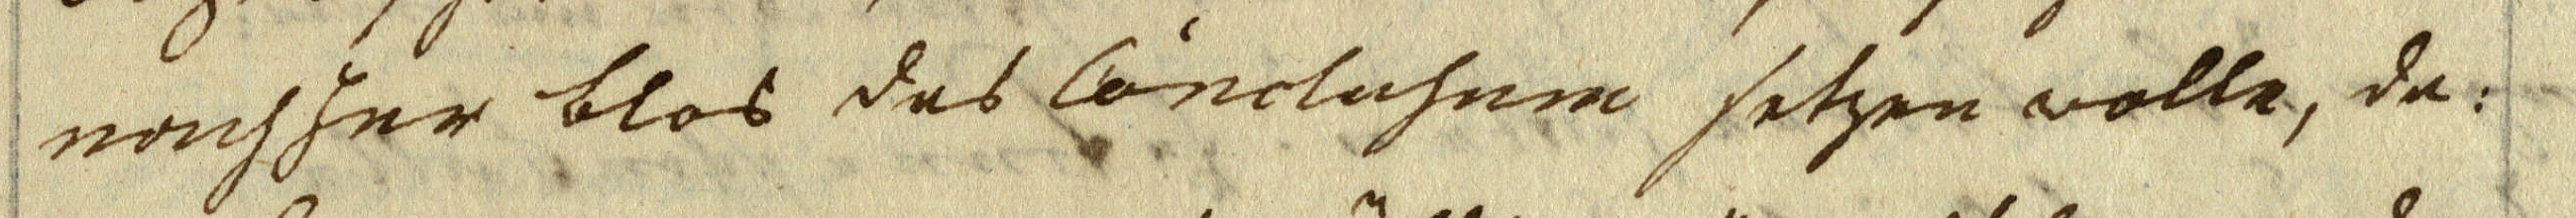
nach her blos das Conclusum setzen wolte, da¬
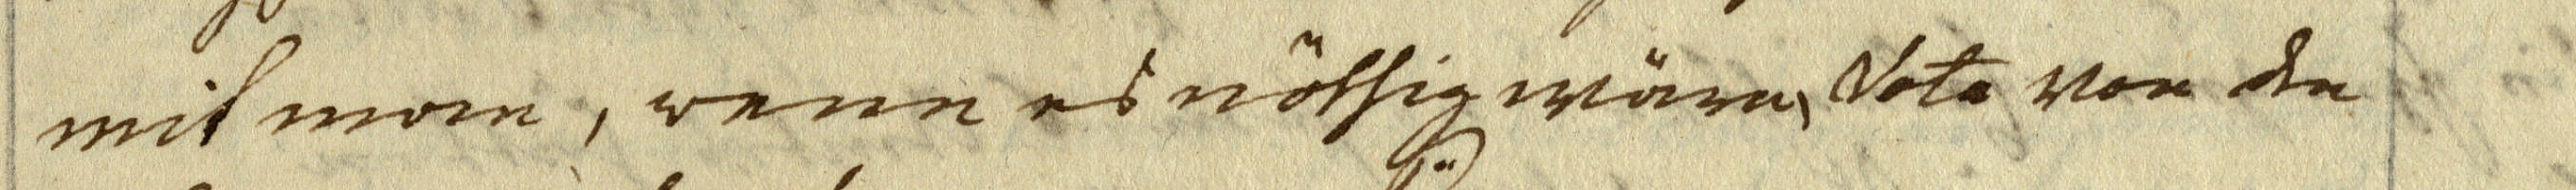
mit man, wenn es nöthig wäre, Vota von den
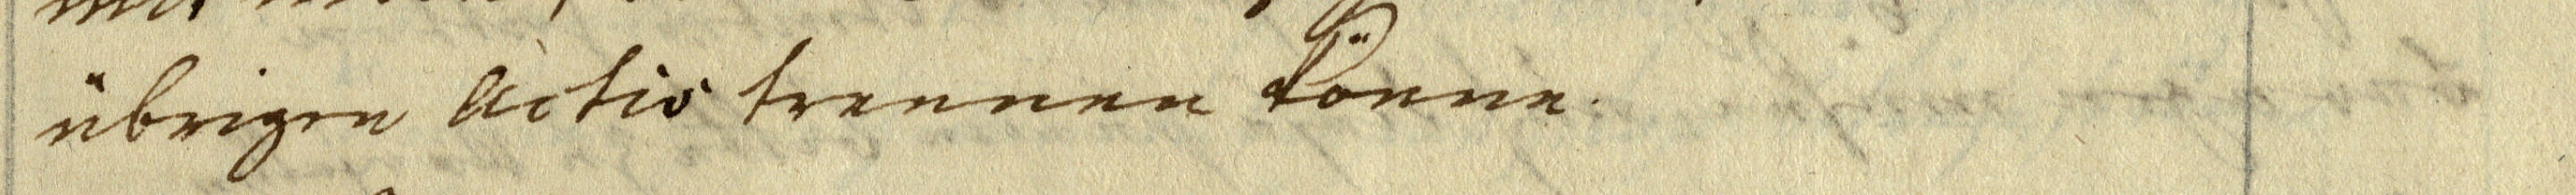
übrigen Actis trennen könne.
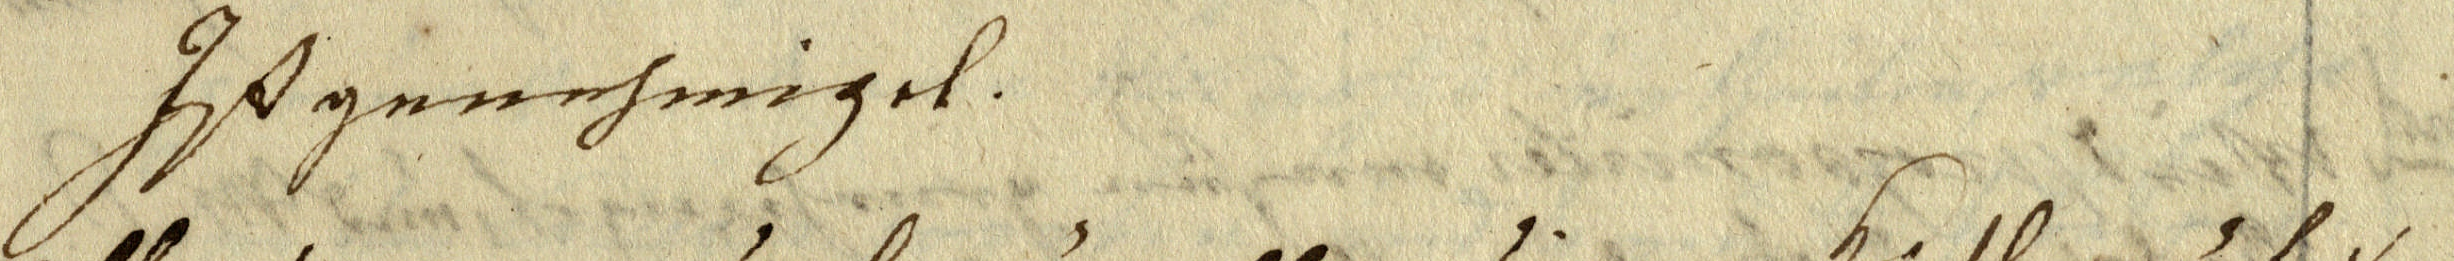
Ist genehmiget.
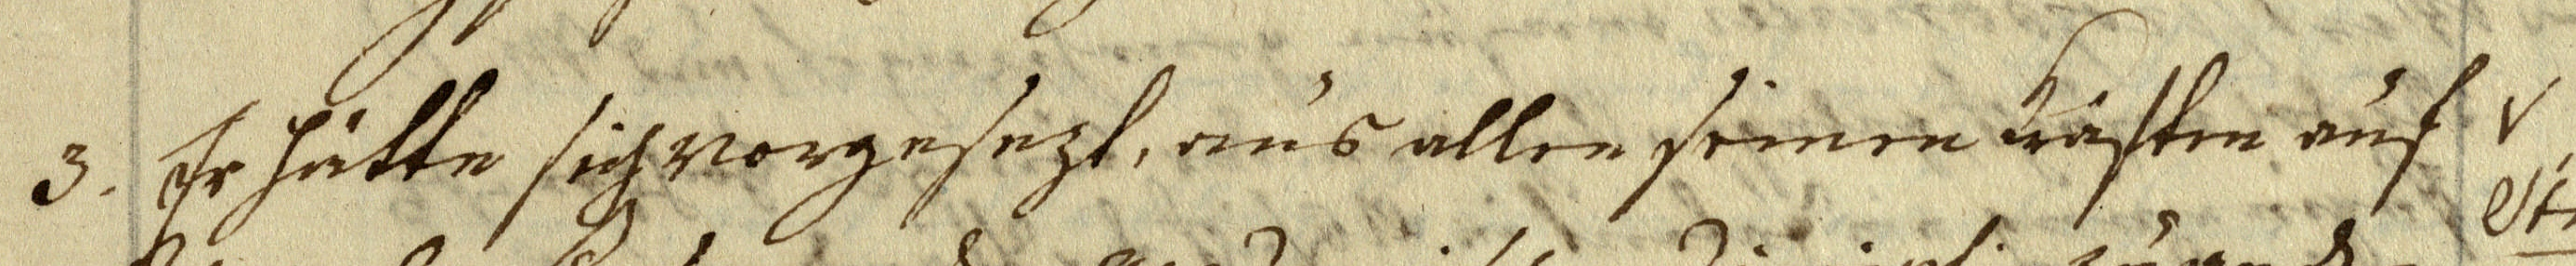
3. Er hätte sich vorgesezt, aus allen seinen Kräften auf
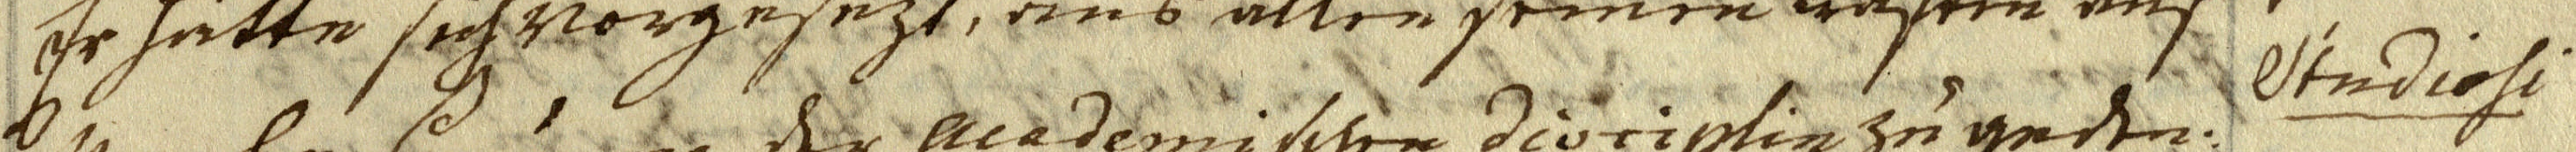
Studiosi
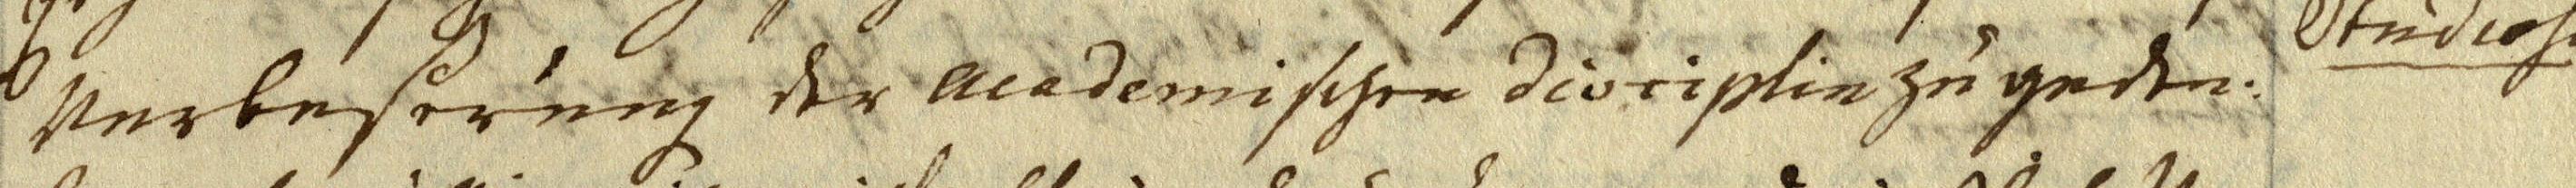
Verbeßerung der Academischen Disciplin zu geden¬
